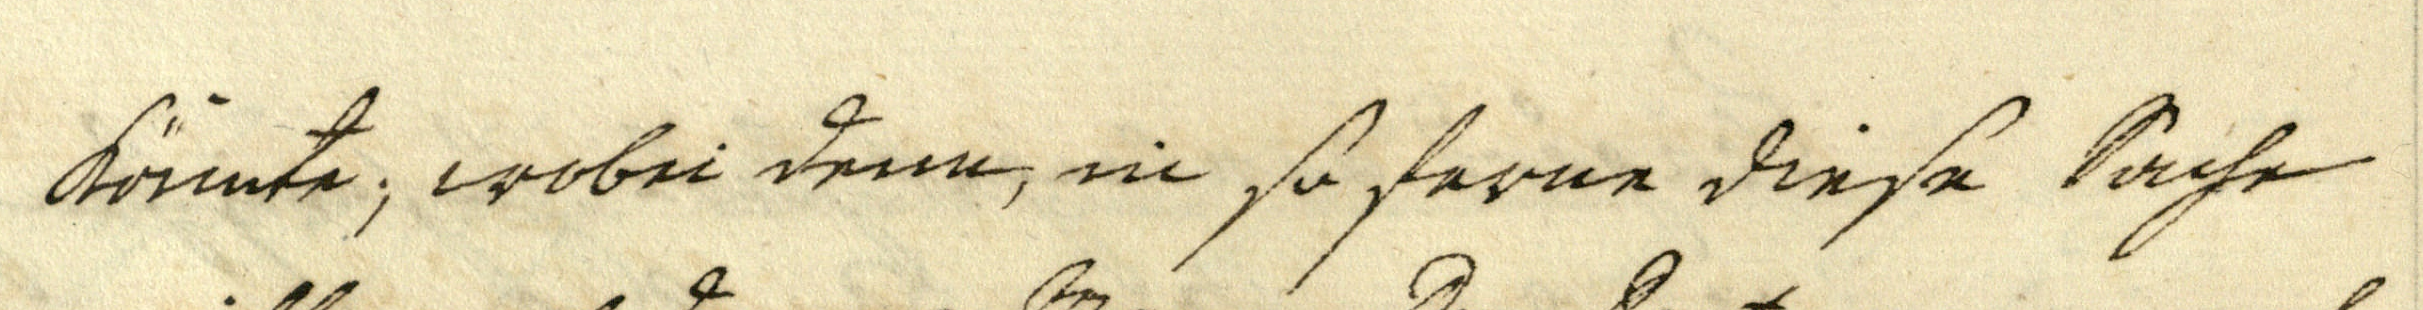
könnte; wobei denn, in so ferne diese Sache
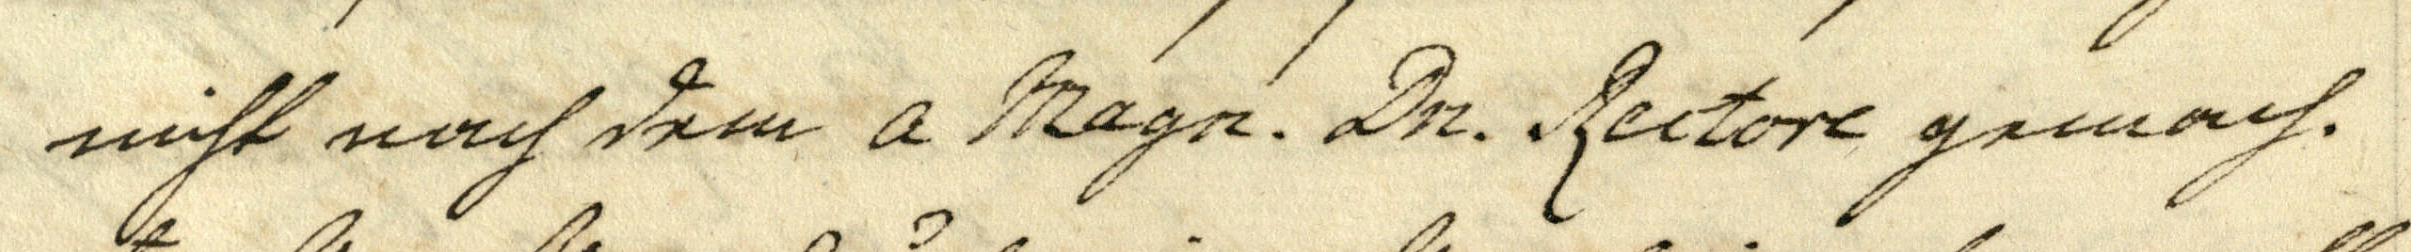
nicht nach dem a Magn. Dn. Rectore gemach¬
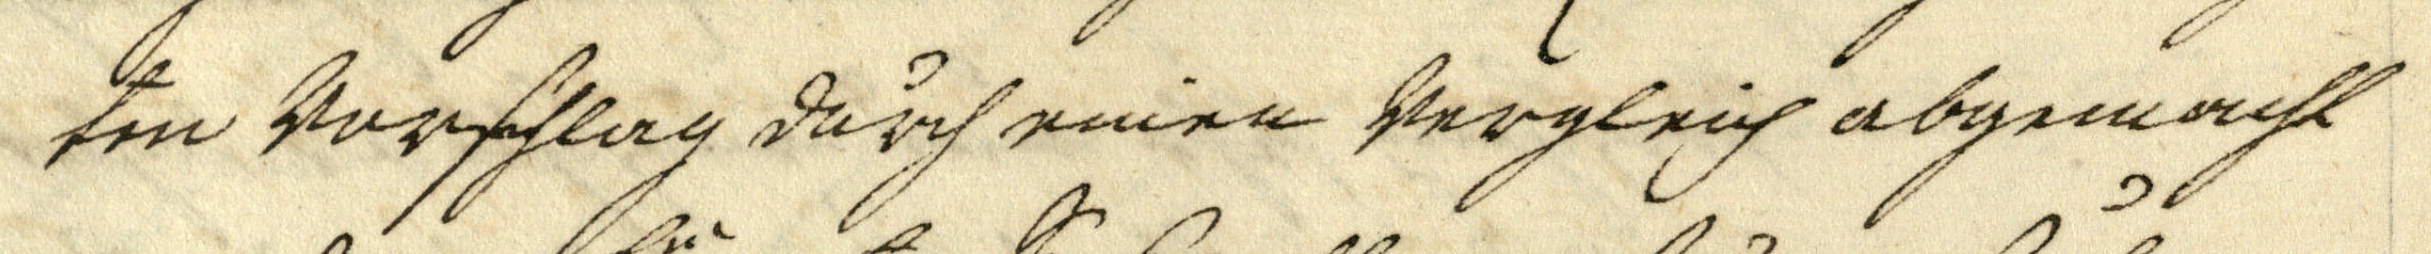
ten Vorschlag durch einen Vergleich abgemacht
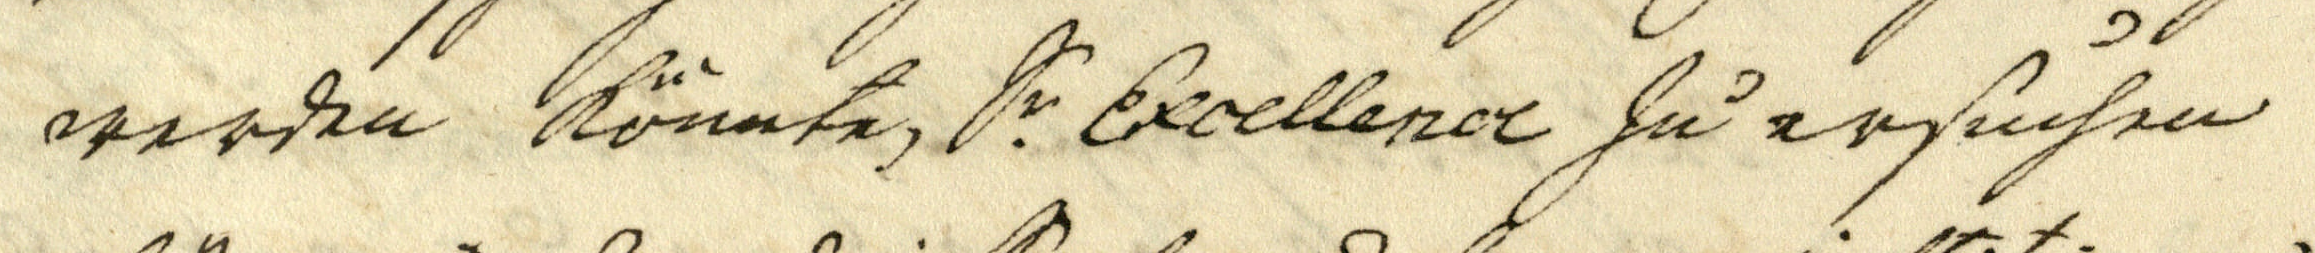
werden könnte, Sr Excellence zu ersuchen
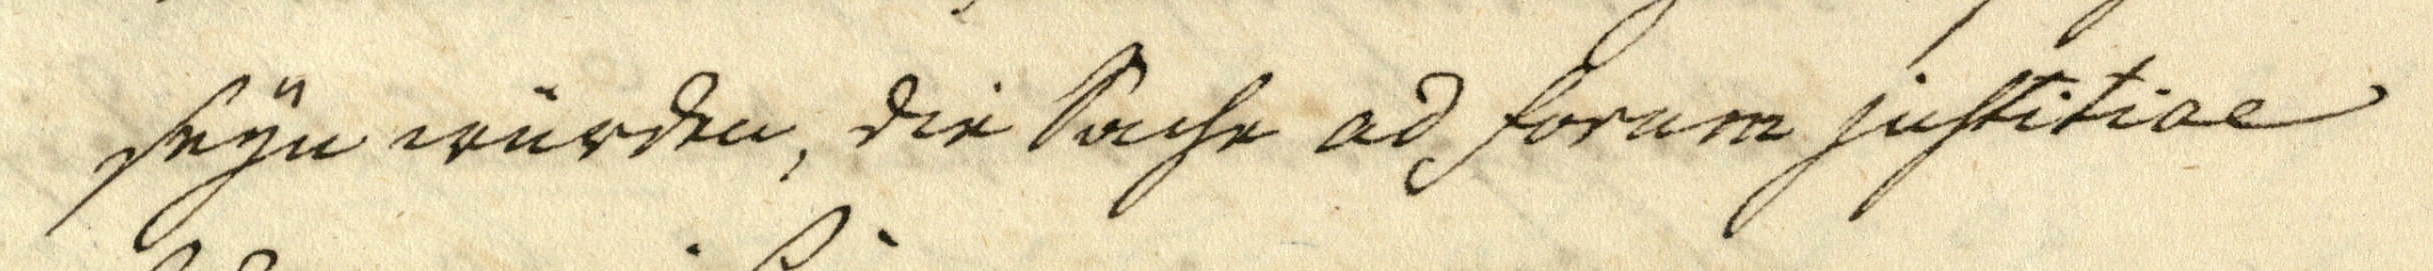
seÿn würden, die Sache ad Forum justitiae
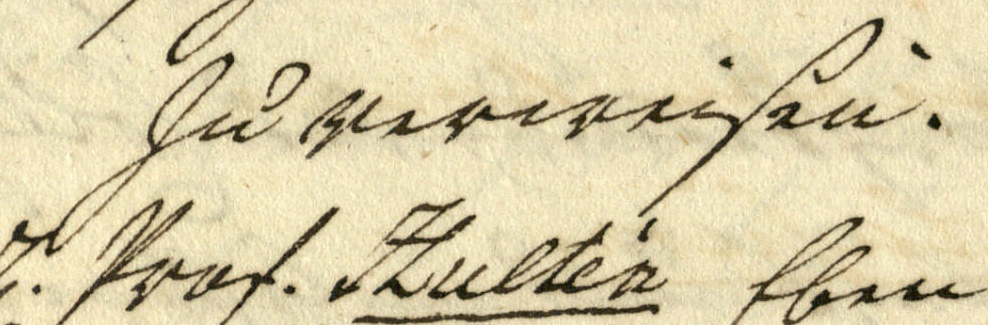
zu verweisen.
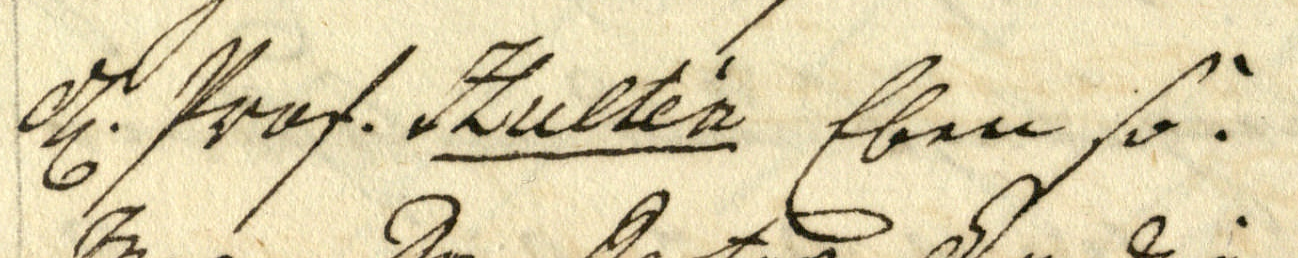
d. Prof. Hultén Eben so.
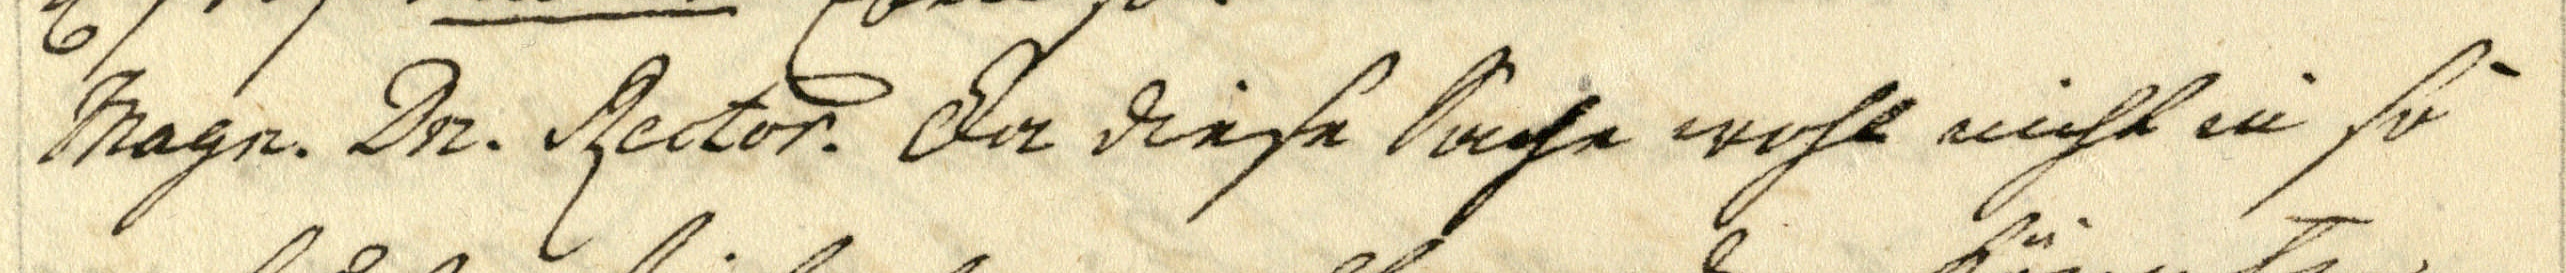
Magn. Dn. Rector. Da diese Sache wohl nicht in so
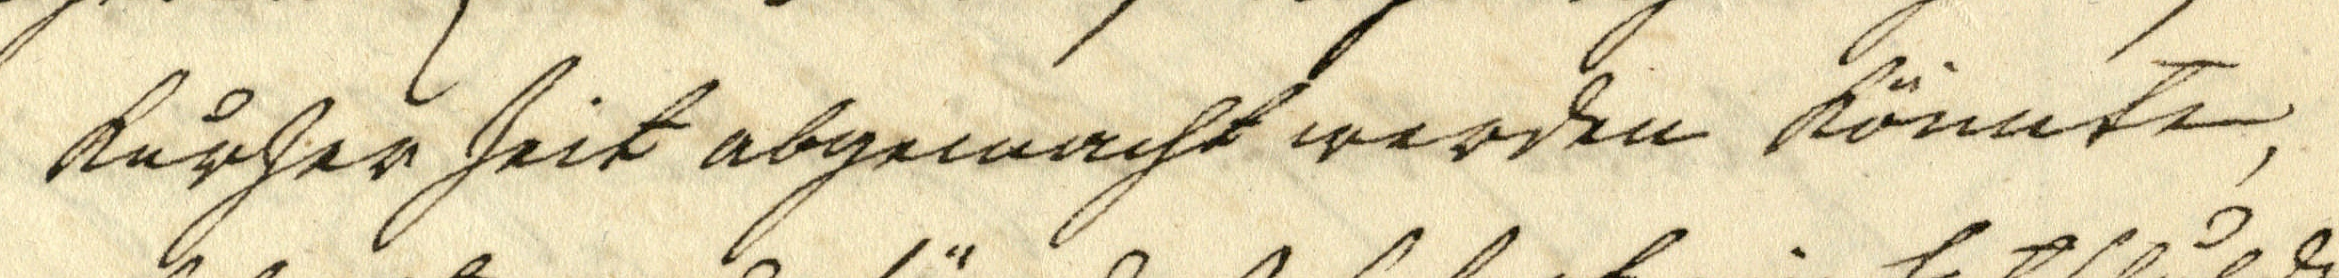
kurzer Zeit abgemacht werden könnte,
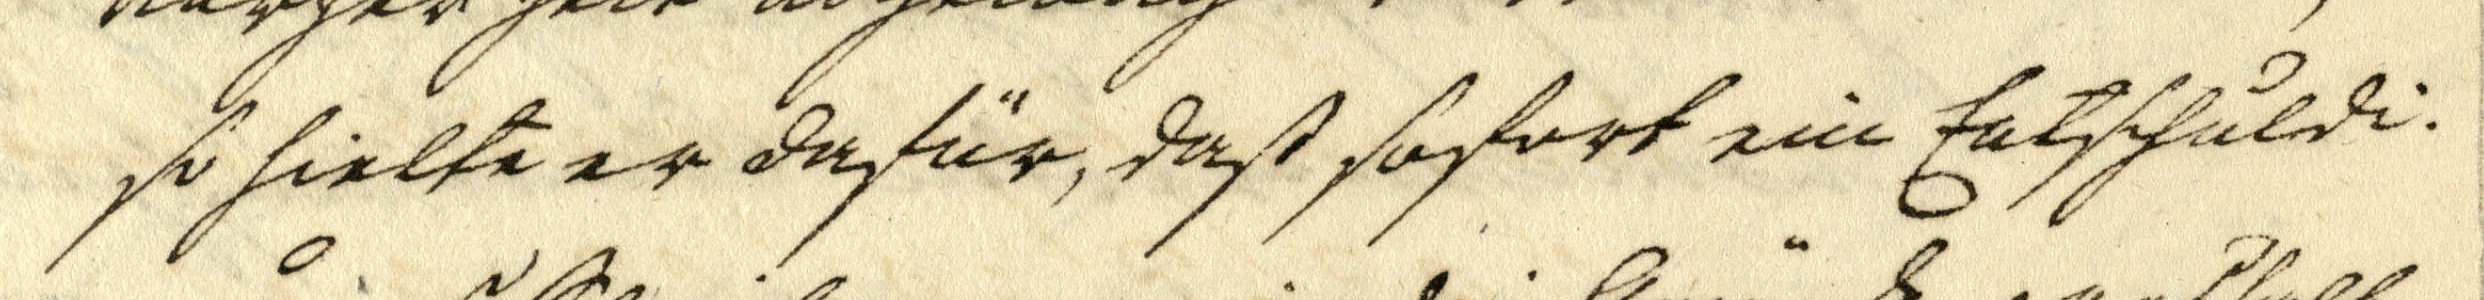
so hielte er dafür, daß sofort ein Entschuldi¬
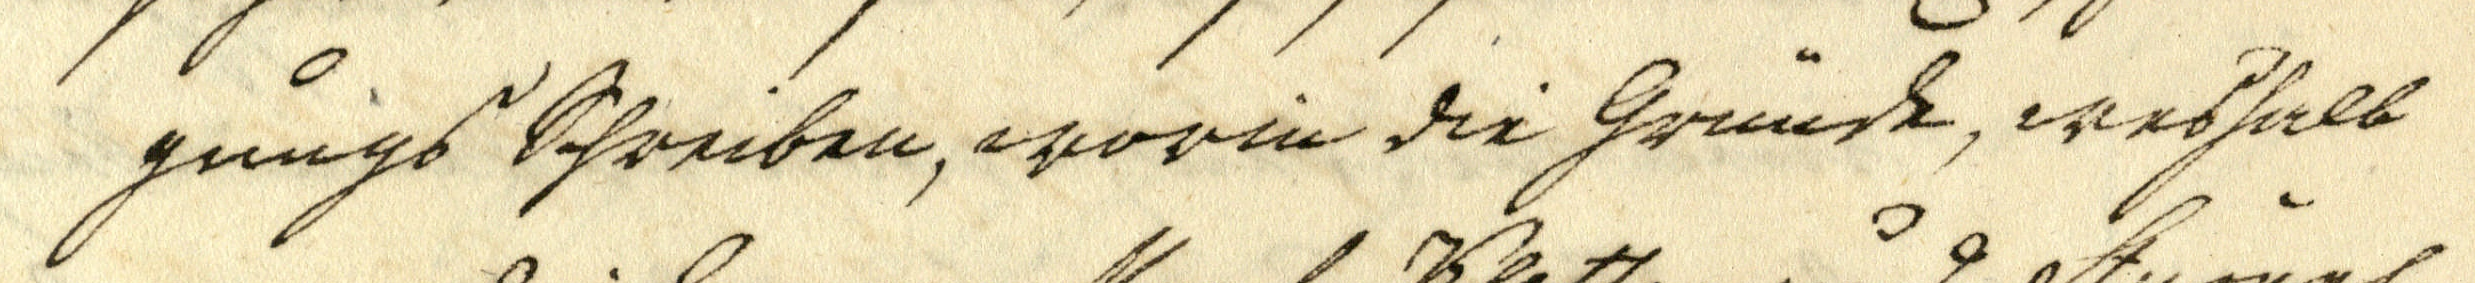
gungs Schreiben, worin die Gründe, weshalb
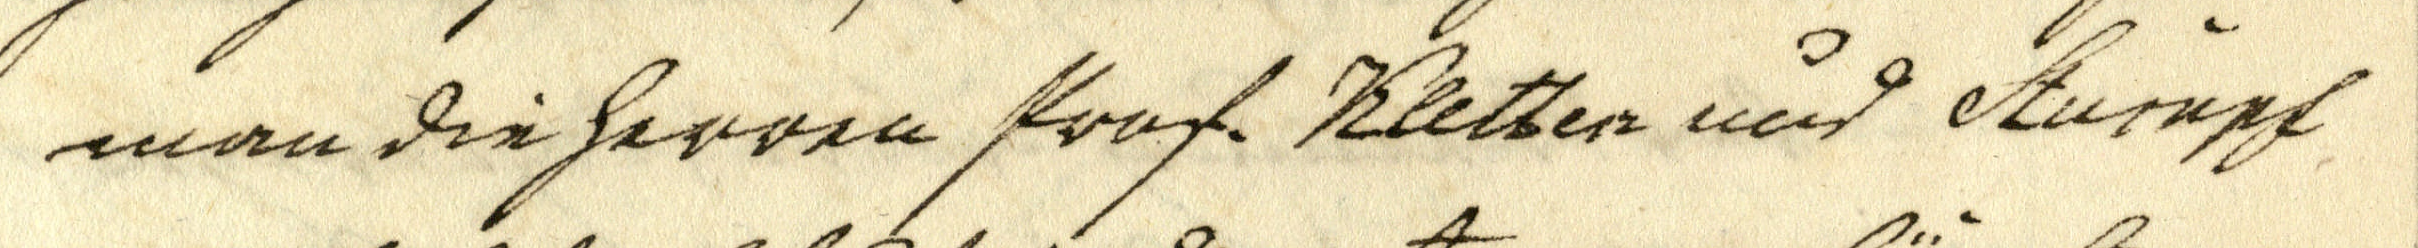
man die Herren Prof. Kletten und Stumpf
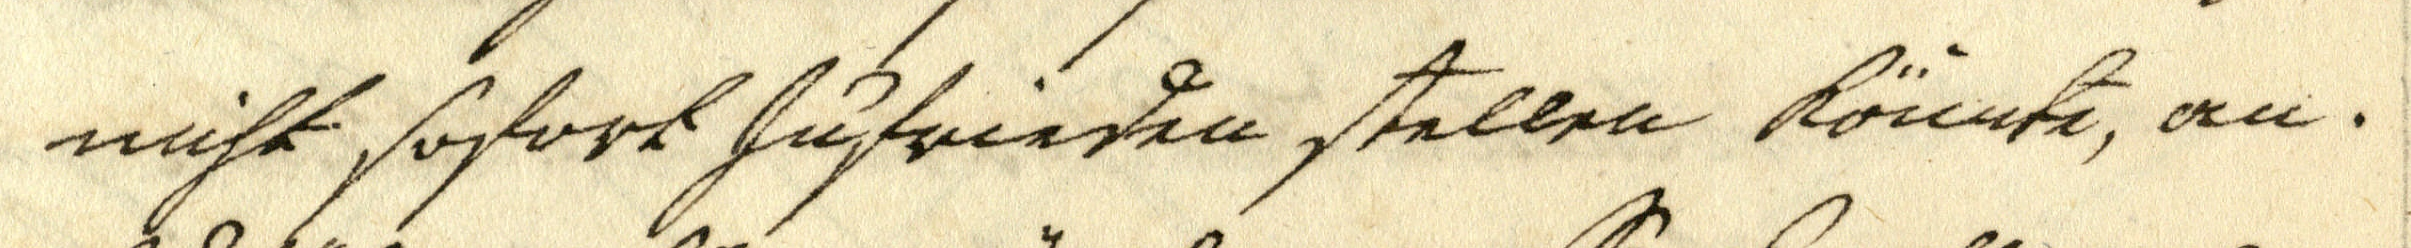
nicht sofort zufrieden stellen könnte, an¬
